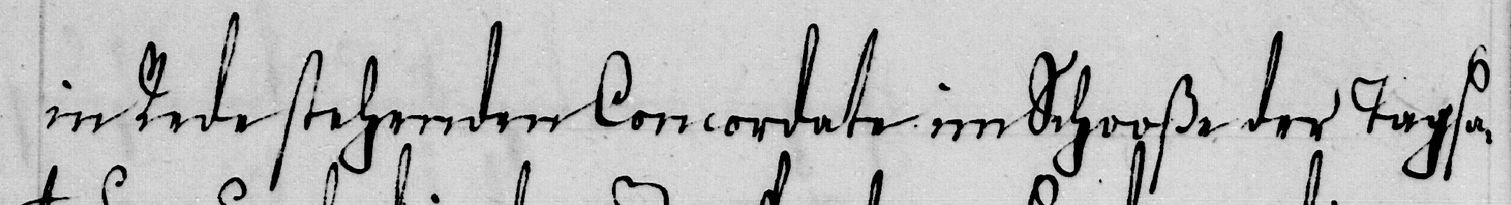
in Rede stehenden Concordate im Schooße der Tagsa¬
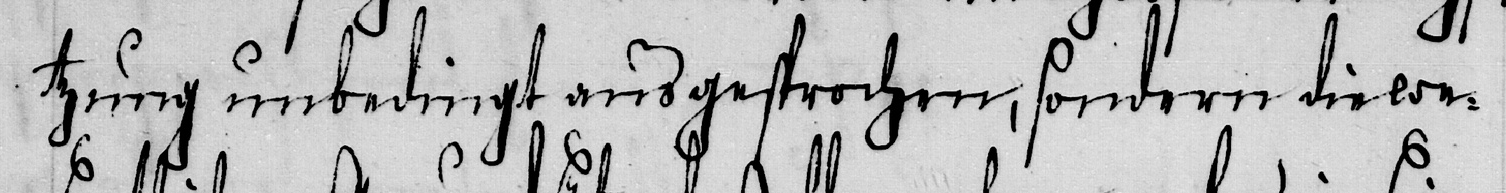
tzung unbedingt ausgesprochen, sondern die we¬
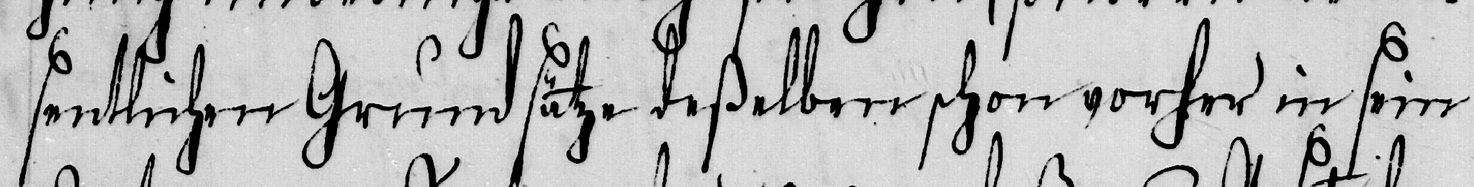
sentlichen Grundsätze deßelben schon vorher in sein
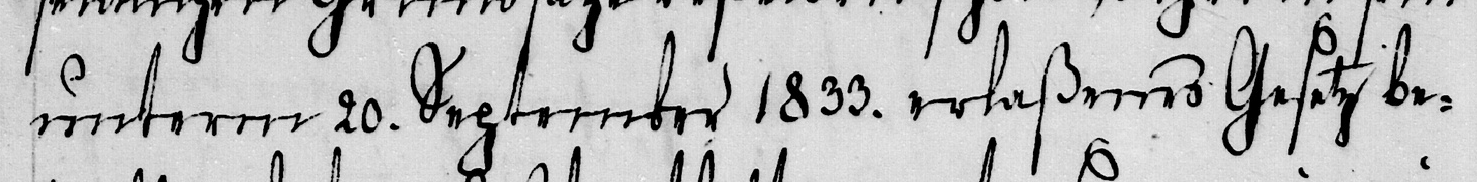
unterm 20. September 1833. erlaßenes Gesetz be¬
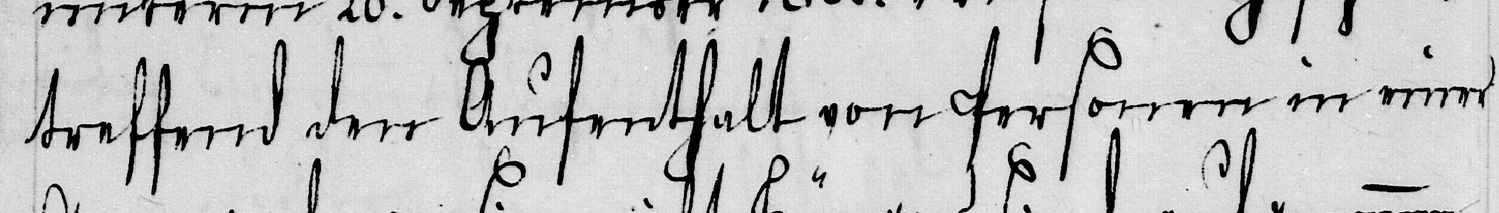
treffend den Aufenthalt von Personen in einer
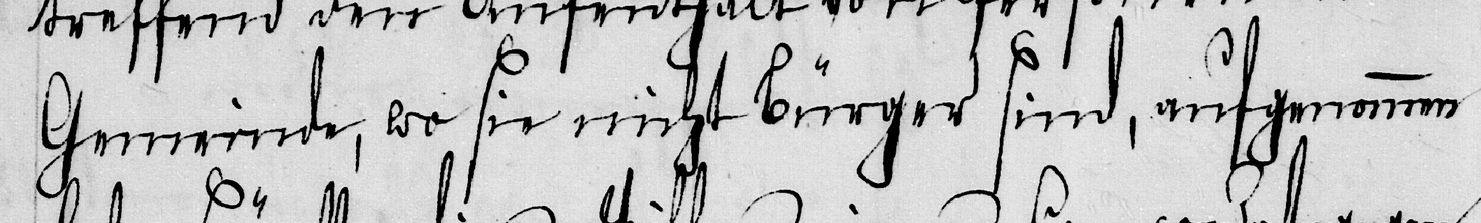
Gemeinde, wo sie nicht Bürger sind, aufgenommen
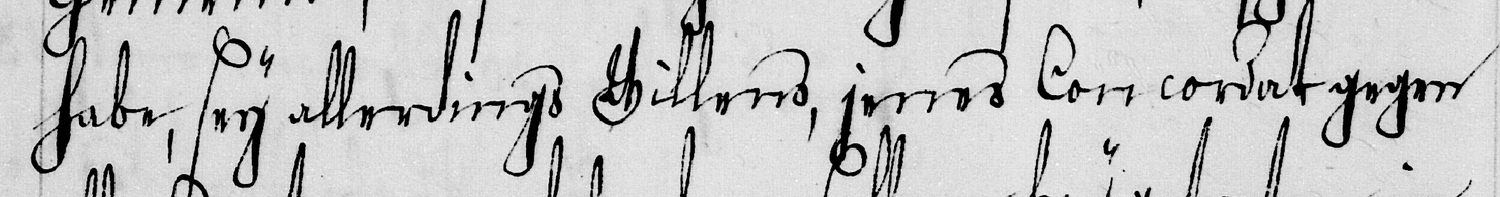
habe, sey allerdings Willens, jenes Concordat gegen
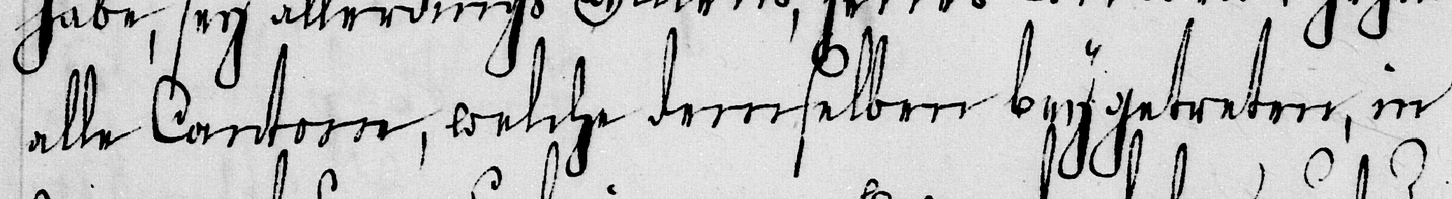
alle Cantone, welche demselben beygetreten, in
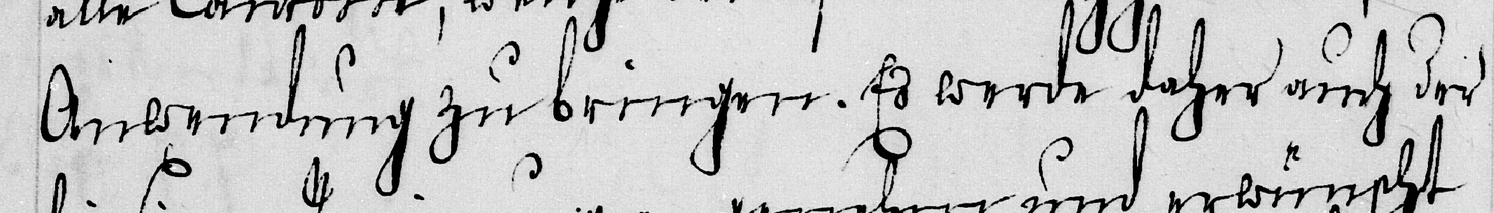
Anwendung zu bringen. Es werde daher auch der
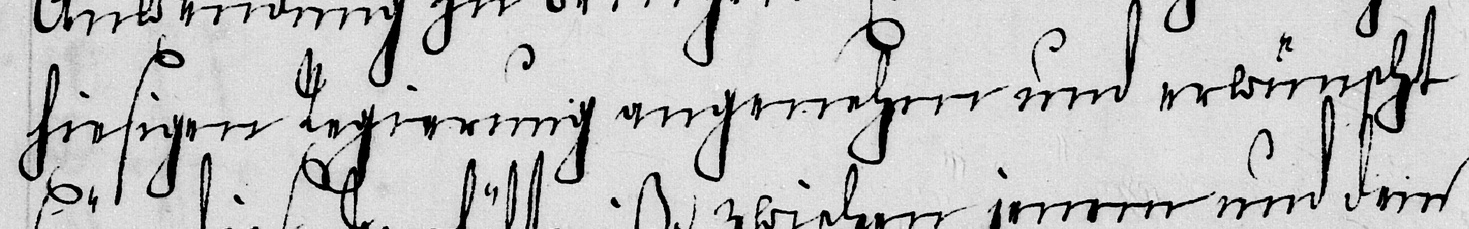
hiesigen Regierung angenehm und erwünscht
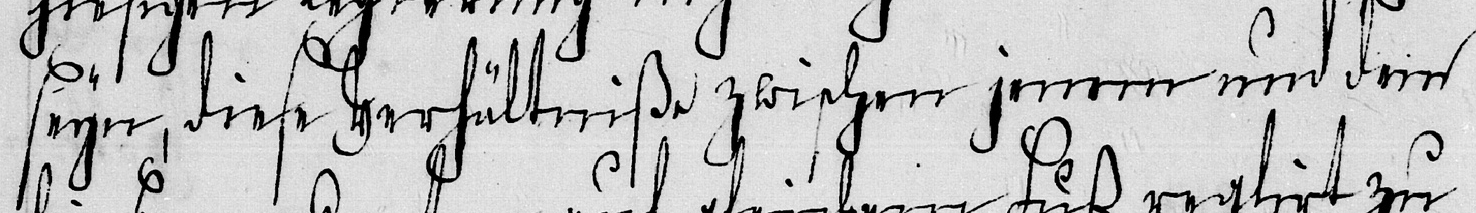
seyn, diese Verhältniße zwischen jenem und dem
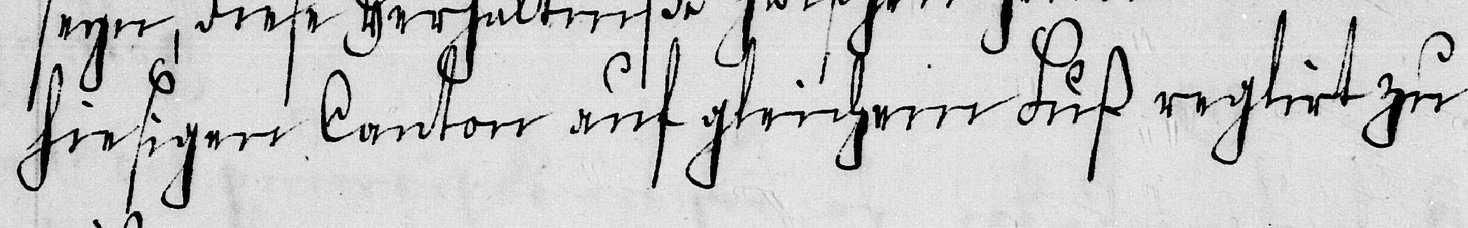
hiesigen Canton auf gleichem Fuß reglirt zu
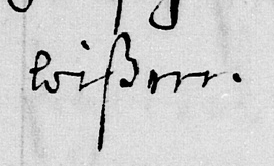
wißen.
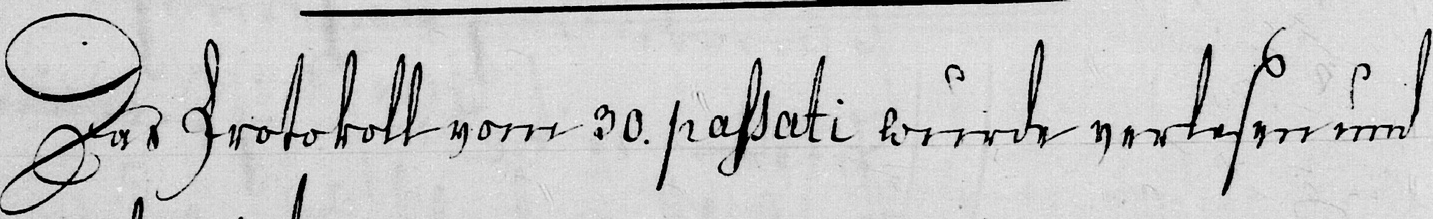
Das Protokoll vom 30. passati wurde verlesen und
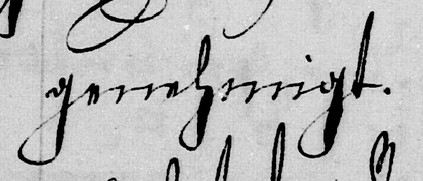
genehmigt.
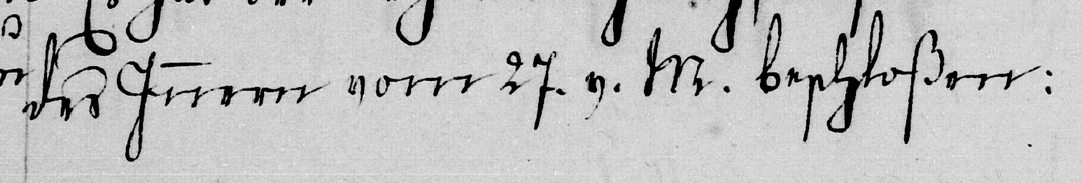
des Innern vom 27. v. M. beschloßen:
